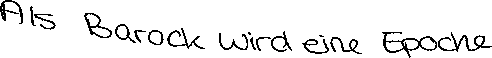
Als Barock wird eine Epoche
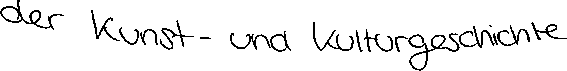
der Kunst- und Kulturgeschichte
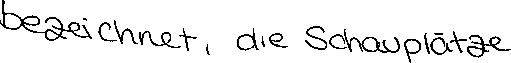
Bezeichnet, die Schauplätze
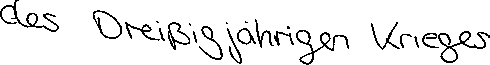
des Dreißigjährigen Kriegs
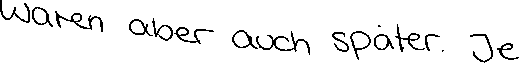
waren aber auch später. Je
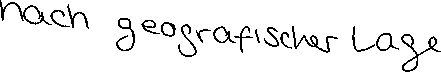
nach geografischer Lage
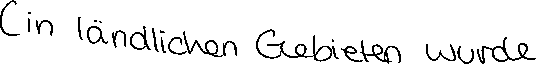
(in ländlichen Gebieten wurde
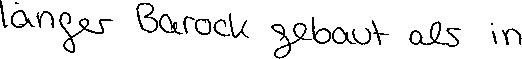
länger barock gebaut als in
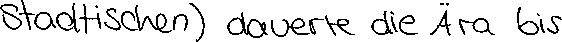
städtischen) dauerte die Ära bis
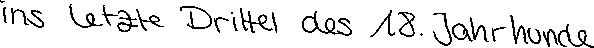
ins letzte Drittel des 18. Jahrhunderts
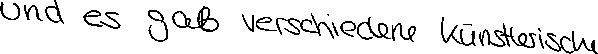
und es gab verschiedene künstlerische
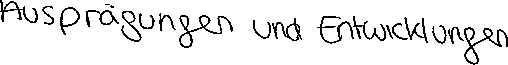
Ausprägungen und Entwicklungen
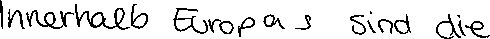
Innerhalb Europas sind die
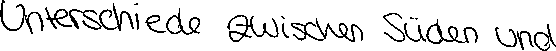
Unterschiede zwischen Süden und
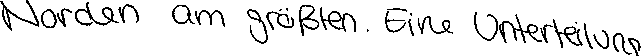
Norden am größten. Eine Unterteilung
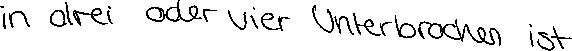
in drei oder vier Unterepochen ist
